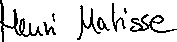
Henri Matisse
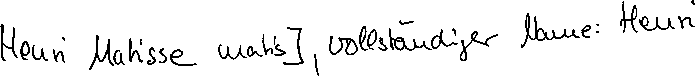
Henri Matisse matis], vollständiger Name: Henri
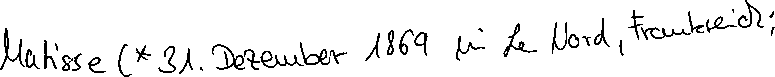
Matisse (* 31. Dezember 1869 in Le Nord, Frankreich;
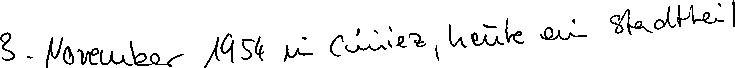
3. November 1954 in Cimiez, heute ein Stadtteil
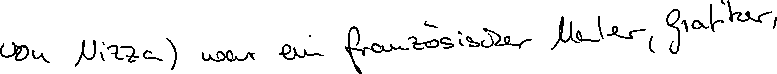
von Nizza), war ein französischer Maler, Grafiker,
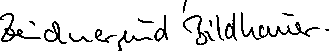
Zeichner und Bildhauer.
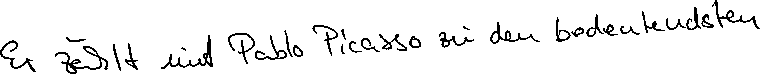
Er zählt mit Pablo Picasso zu den bedeutendsten
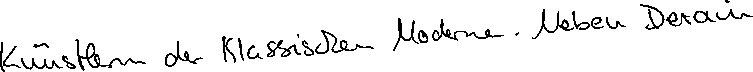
Künstlern der Klassischen Moderne. Neben Derain
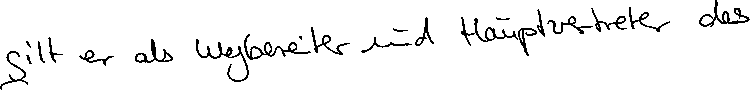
gilt er als Wegbereiter und Hauptvertreter des
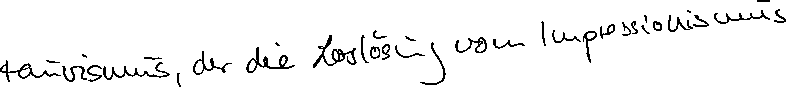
Fauvismus, der die Loslösung vom Impressionismus
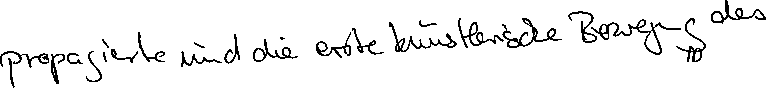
propagierte und die erste künstlerische Bewegung des
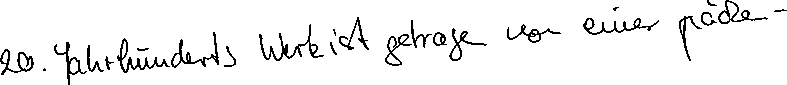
20. Jahrhunderts Werk ist getragen von einer fläche-
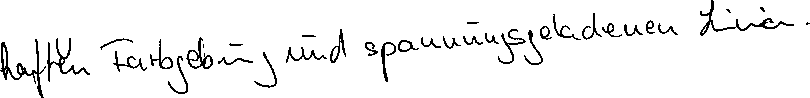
haften Farbgebung und spannungsgeladenen Linien.
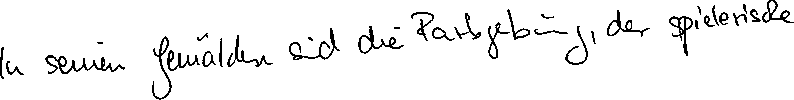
In seinen Gemälden sind die Farbgebung, der spielerische
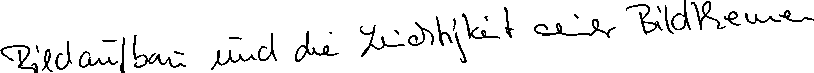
Bildaufbau und die Leichtigkeit seiner Bildthemen
